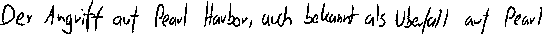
Der Angriff auf Pearl Harbor, auch bekannt als Überfall auf Pearl
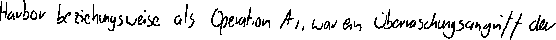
Harbor beziehungsweise als Operation Ai, war ein Überraschungsangriff der
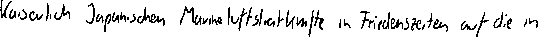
Kaiserlich Japanischen Marineluftstreitkräfte in Friedenszeiten auf die in
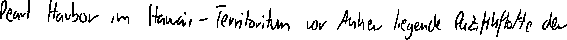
Pearl Harbor im Hawaii-Territorium vor Anker liegende Pazifikflotte der
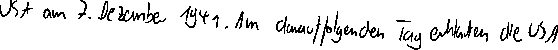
USA am 7. Dezember 1941. Am darauffolgenden Tag erklärten die USA
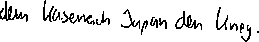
dem Kaiserreich Japan den Krieg.
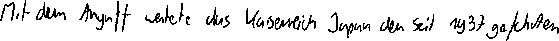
Mit dem Angriff weitete das Kaiserreich Japan den seit 1937 geführten
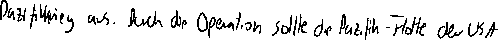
Pazifikkrieg aus. Durch die Operation sollte die Pazifik-Flotte der USA
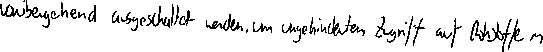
vorübergehend ausgeschaltet werden, um ungehinderten Zugriff auf Rohstoffe in
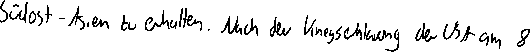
Südost-Asien zu erhalten. Nach der Kriegserklärung der USA am 8
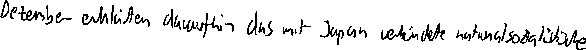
Dezember erklärten daraufhin das mit Japan verbündete nationalsozialistische
